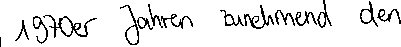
1970er Jahren zunehmend den
